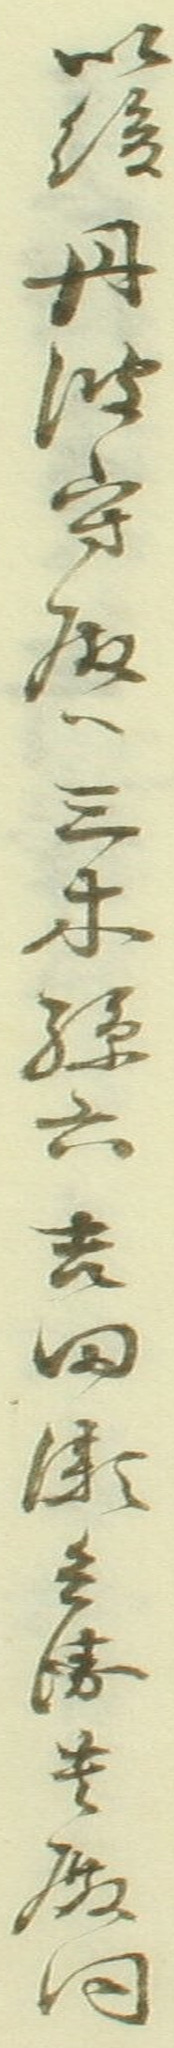以後丹波守殿は三木孫六吉田瀬兵衛貴殿同
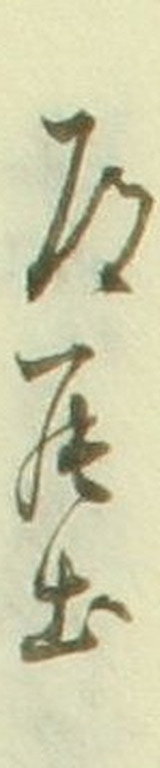道罷出
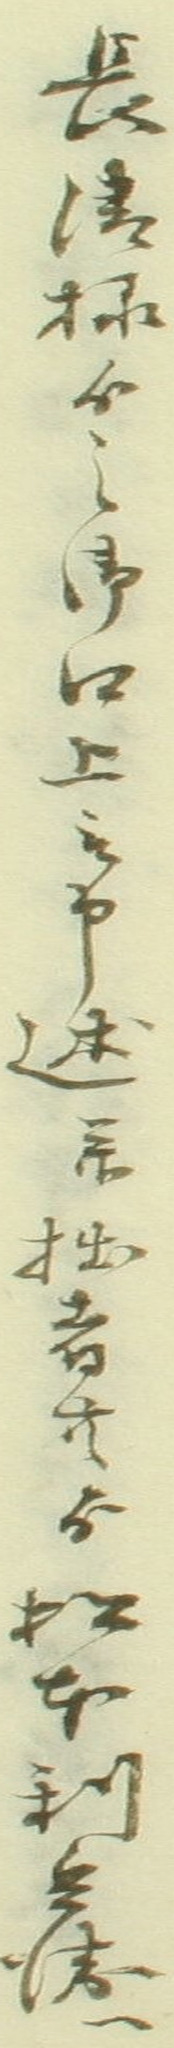長清様ゟ之御口上被申述并拙者共ゟ松本利兵衛へ
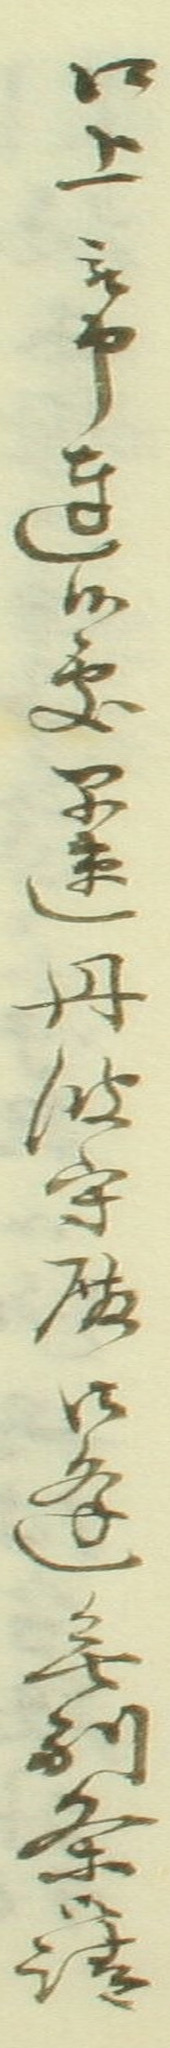口上被申達候処早速丹波守御逢無別条御請
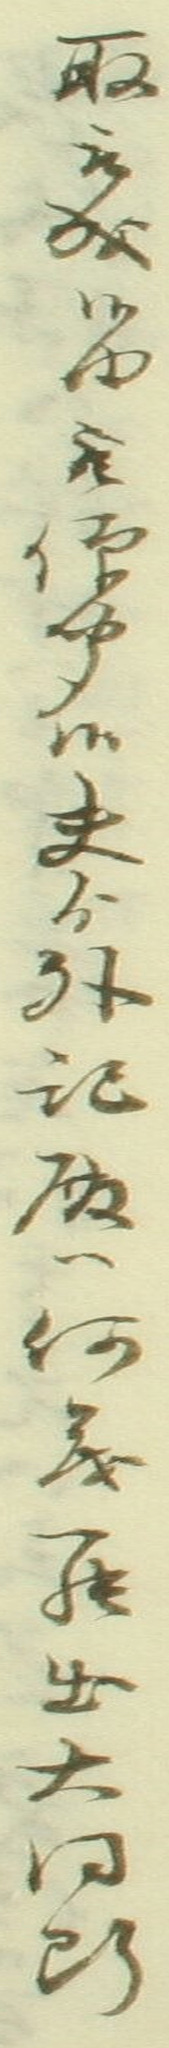取被成候由被仰聞候夫ゟ外記殿は何茂罷出右同断
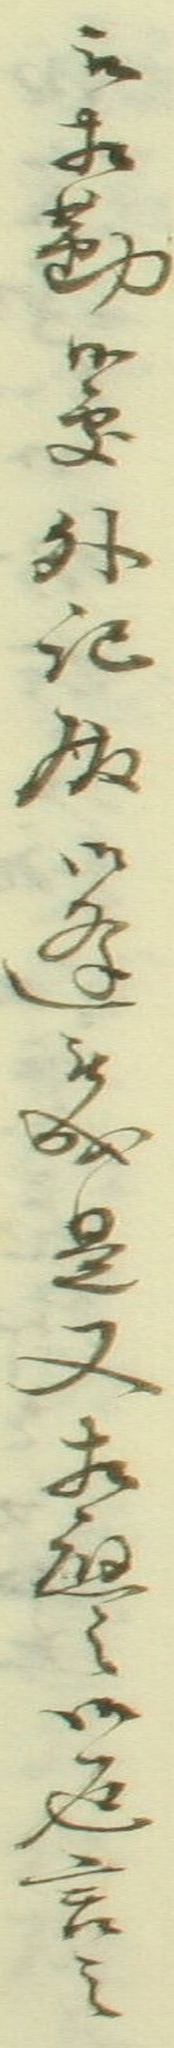被相勤候処外記殿御逢被成是又相応之御返言之

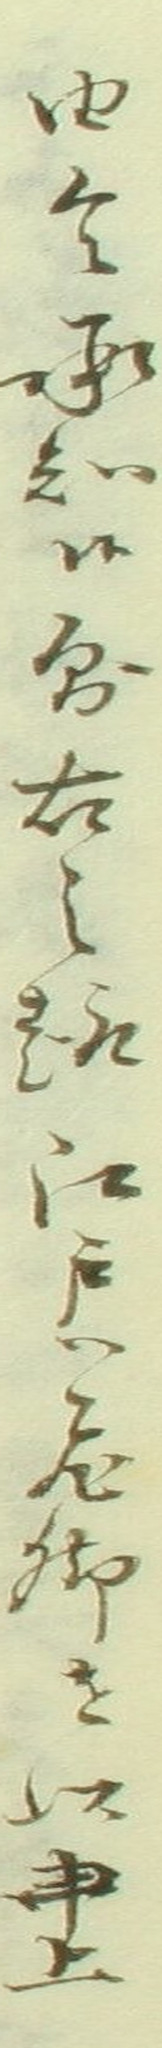由令承知候則右之趣江戸へ飛脚を以申上
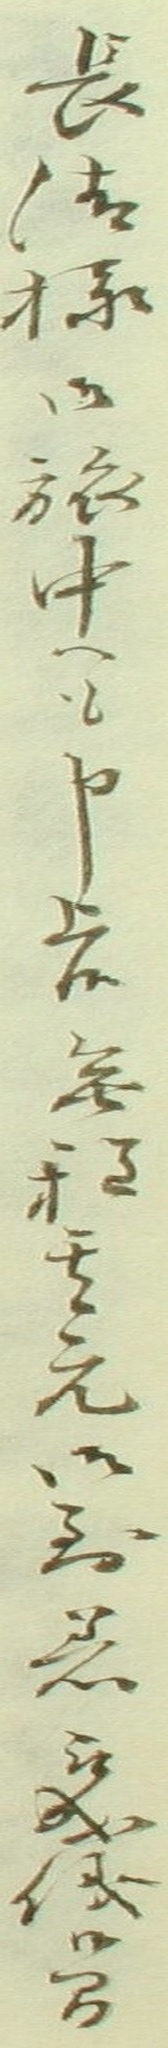長清様御旅中へも申上候無程其元御到着被成儀候間
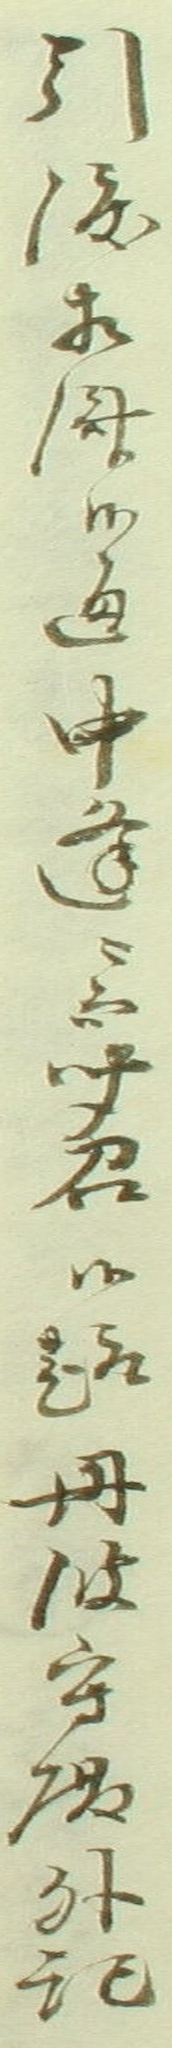引渡相済候通中逢に而聞召候趣丹波守殿外記
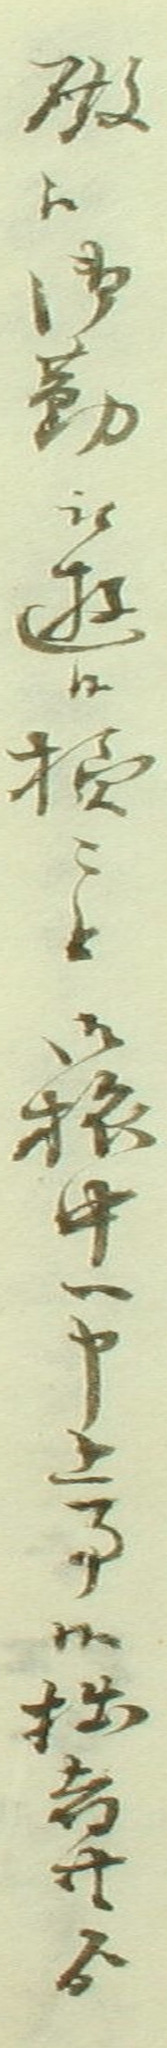殿え御勤被遊候様にと御旅中へ申上事候拙者共ゟ
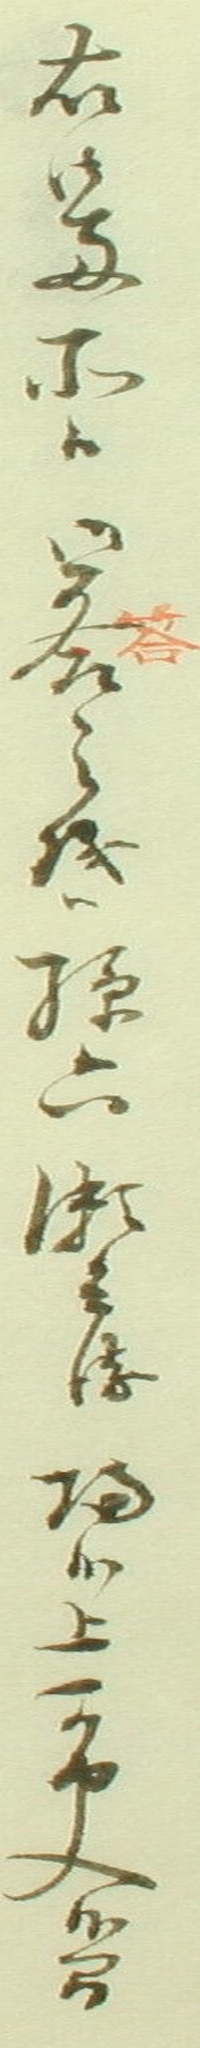右御両所え御答之儀は孫六瀬兵衛帰候上可受候間
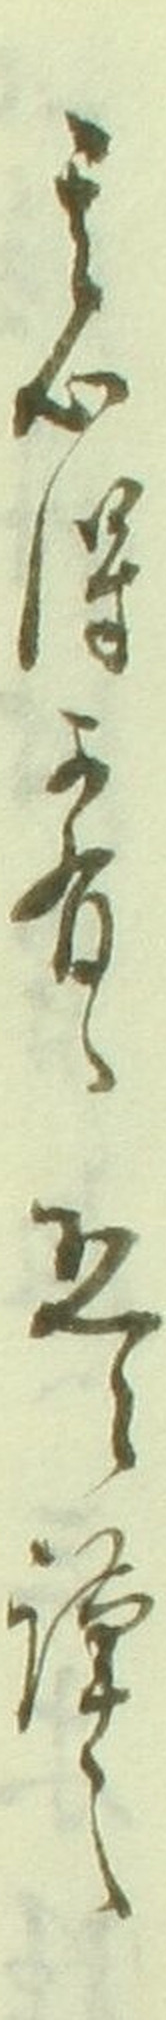其心得可有之候恐々謹言
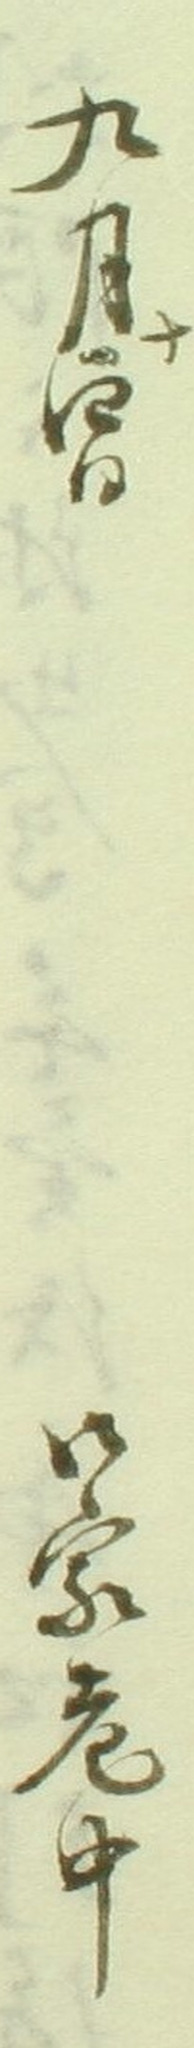九月十四日御家老中
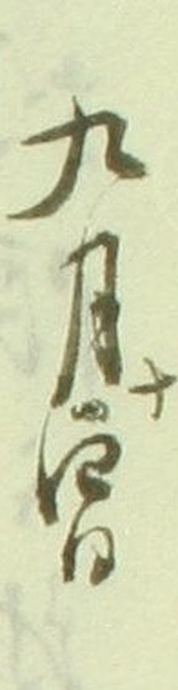九月廿七日
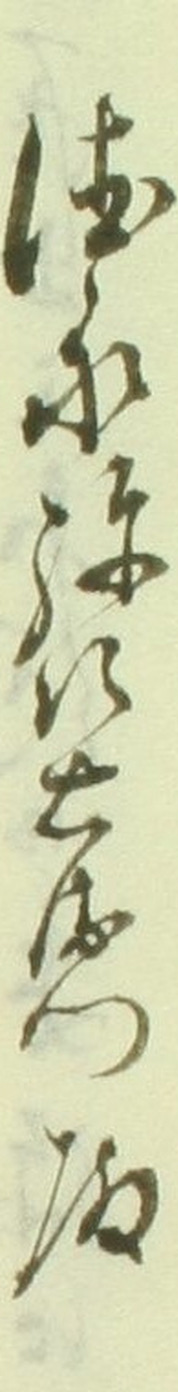徳永弥次右衛門殿
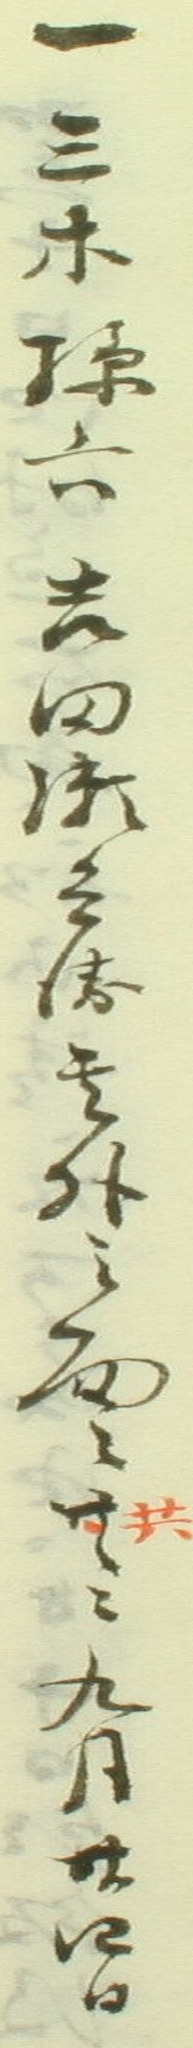一三木孫六吉田瀬兵衛其外之面々共に九月廿四日
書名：異国船漂着記
